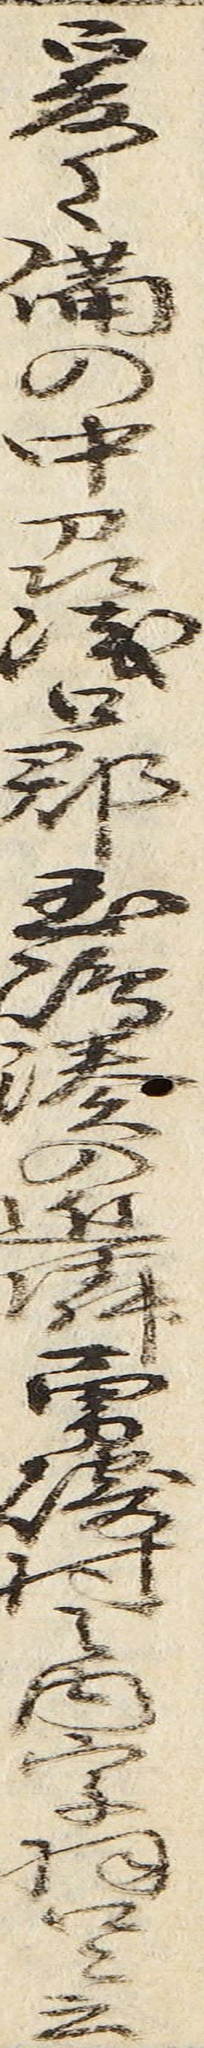爰に備の中州浅口郡玉島湊の近隣勇崎村之内字羽口と云
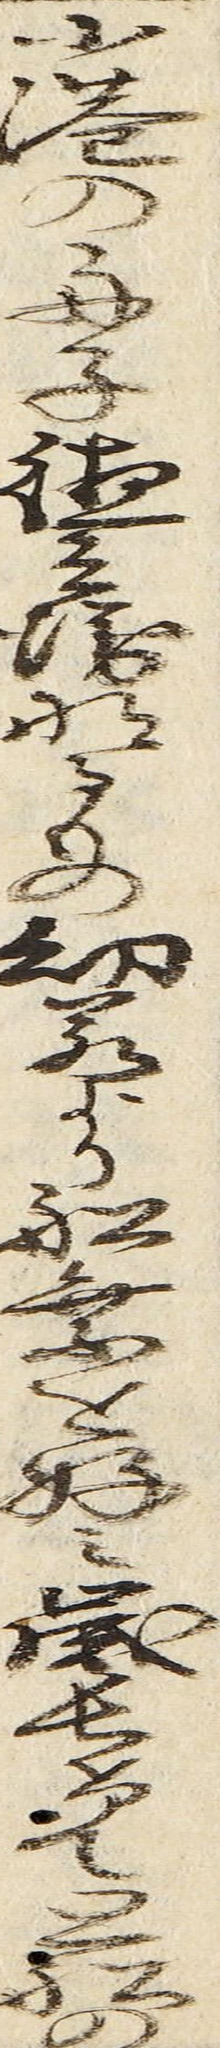小港の舟子徳兵衛なるもの幼若より船乗を好み歳長けて廻船の
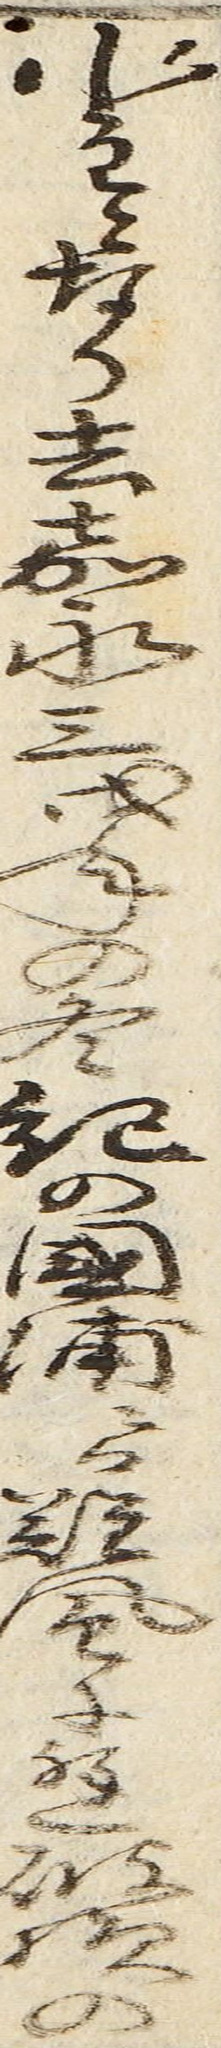水主となり去嘉永三戌年の冬紀の国浦に而難風に逢破損の
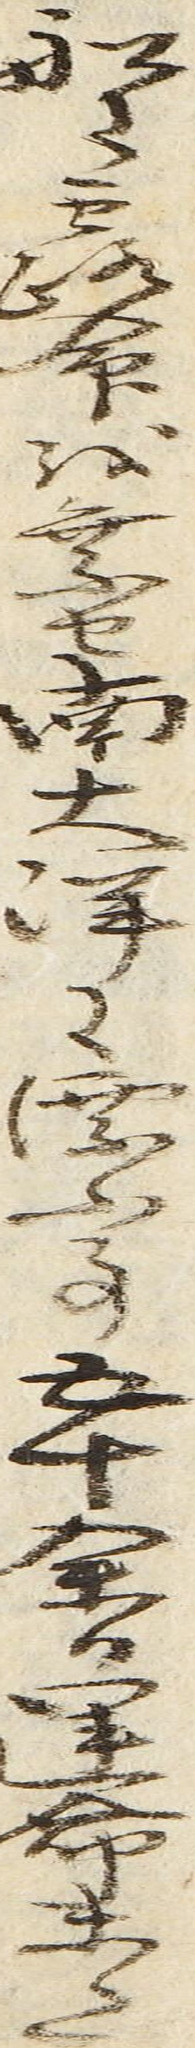船に露命を乗せ南大洋に漂ふ事五十余日運命末た
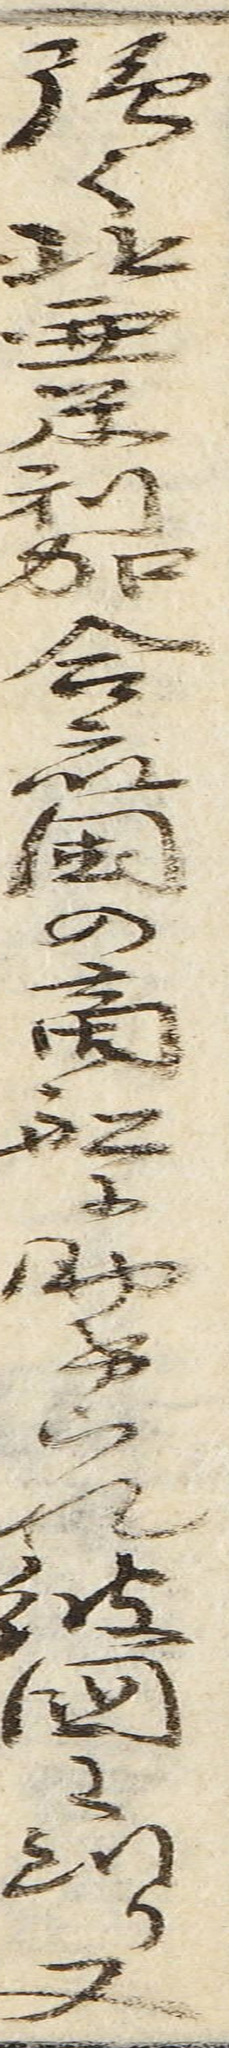強く北亜米利加合衆国の商船に助けられ彼国に到り又
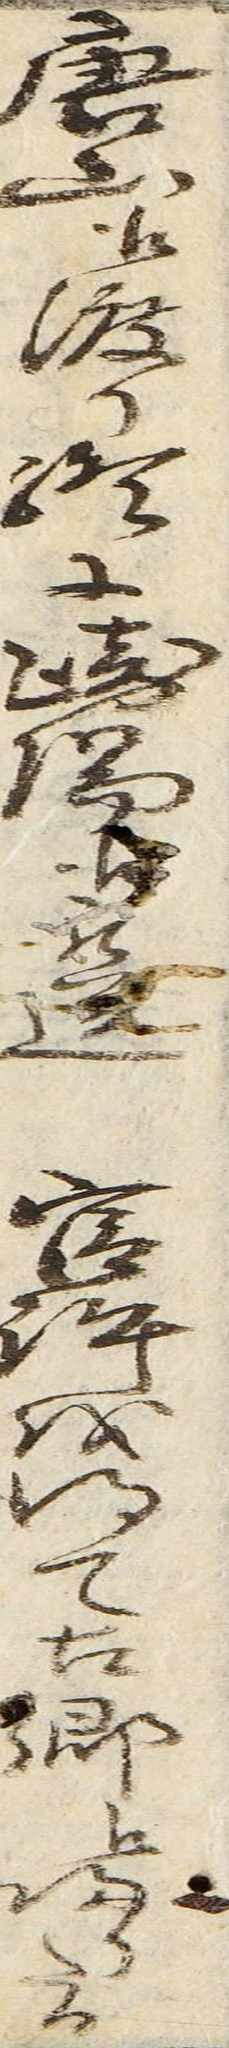唐山江渡り終に崎陽江被送官許を得て古郷江帰りたる
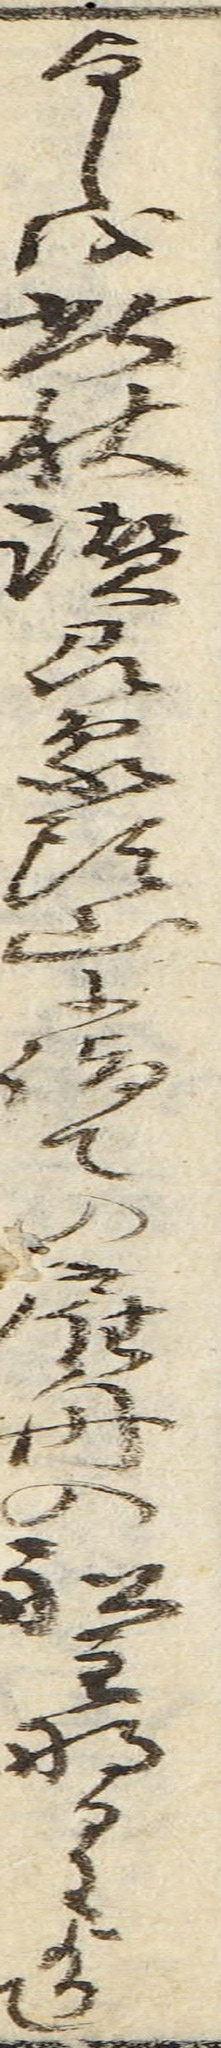よしを此秋讃州象頭山詣ての雇舟の船主なるによりて
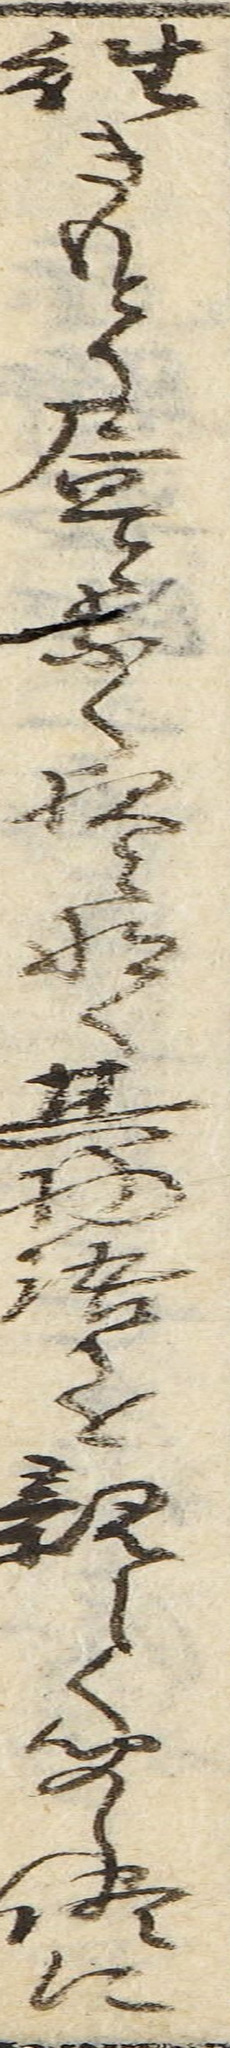往きもとり昼となく夜となく其物語りを親しく聞し侭に
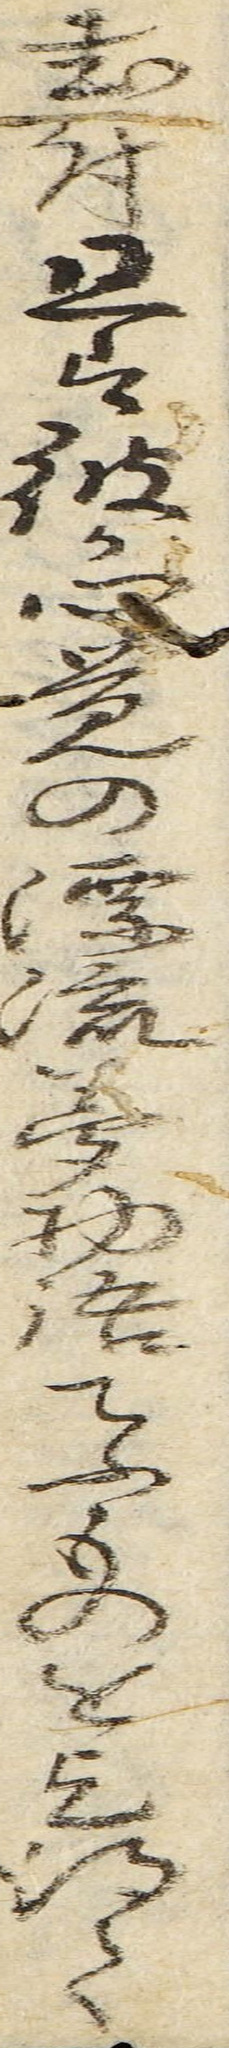書付且は彼か心覚の漂流夢物語てふものを乞得て

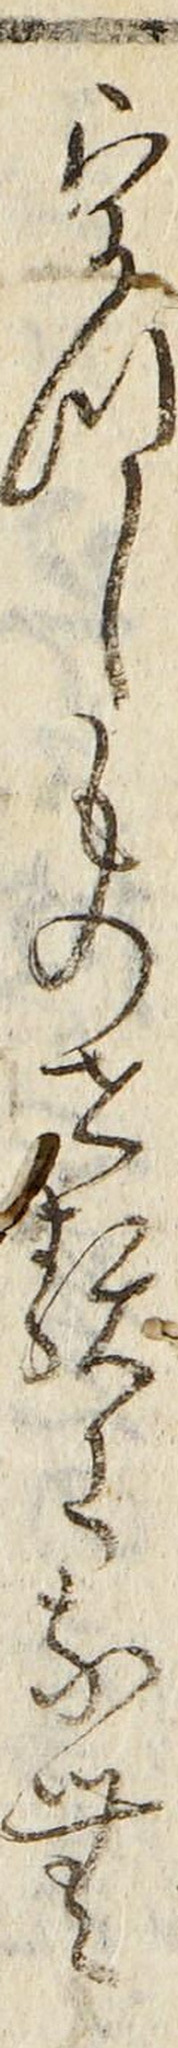うつしものせるになむ
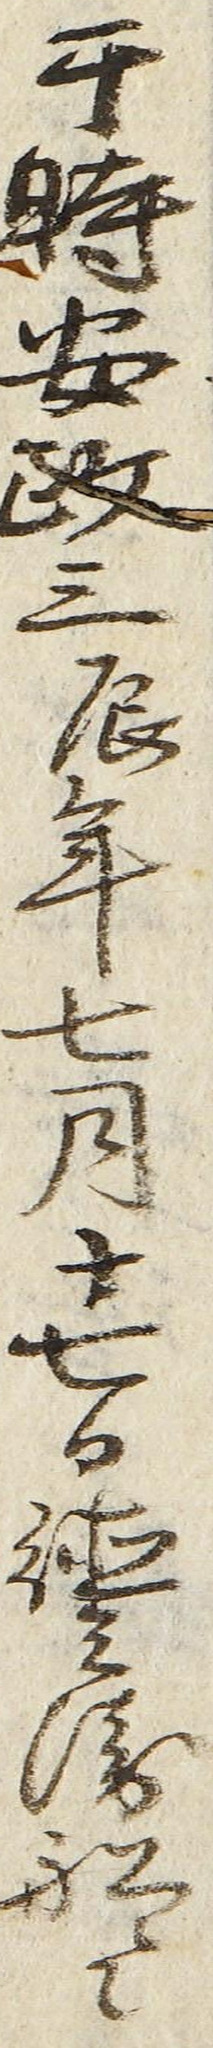于時安政三辰年七月十七日徳兵衛船にて
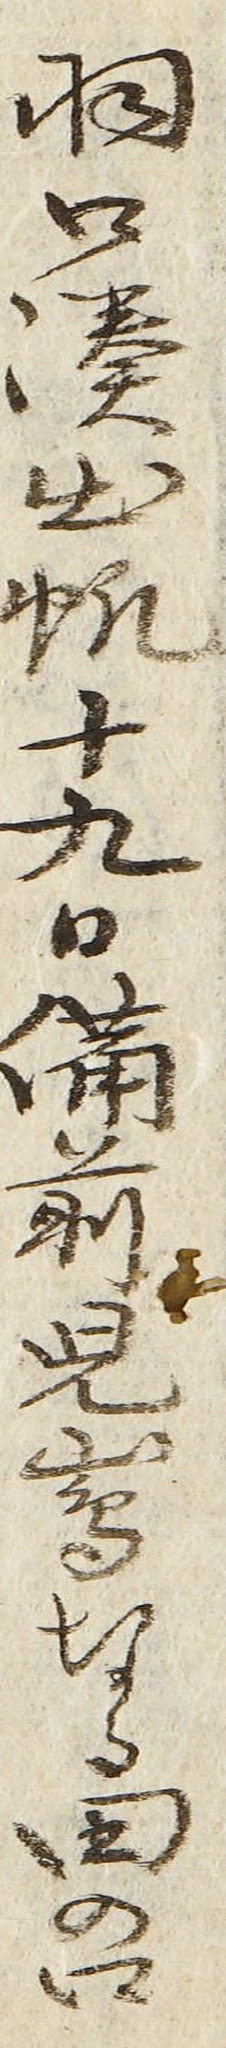羽口湊出帆十九日備前児島なる田の口
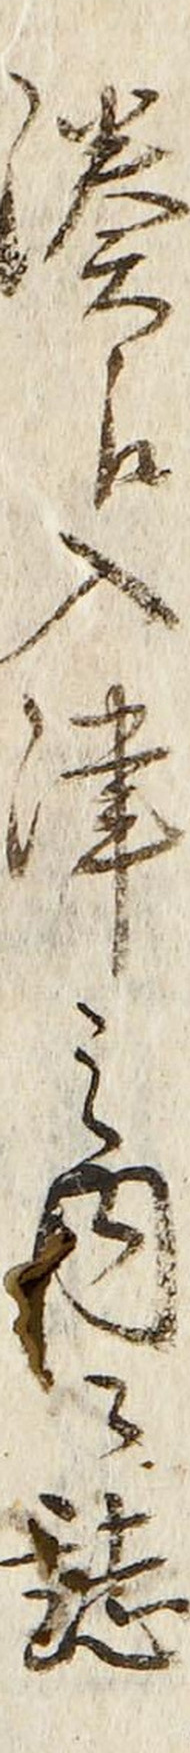湊江入津之内に誌
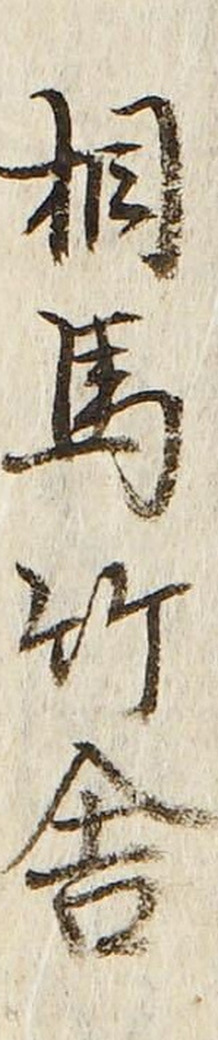相馬竹舎
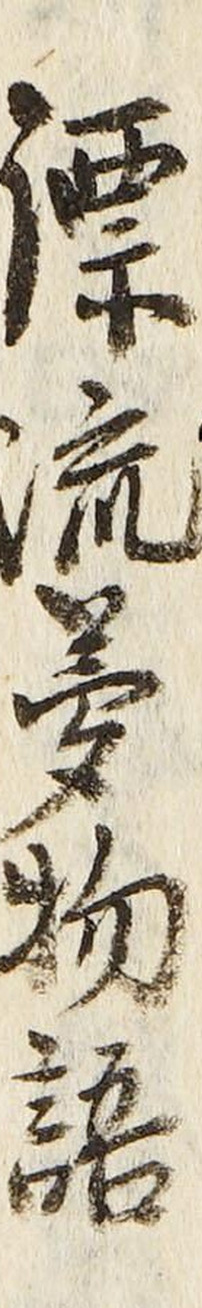漂流夢物語
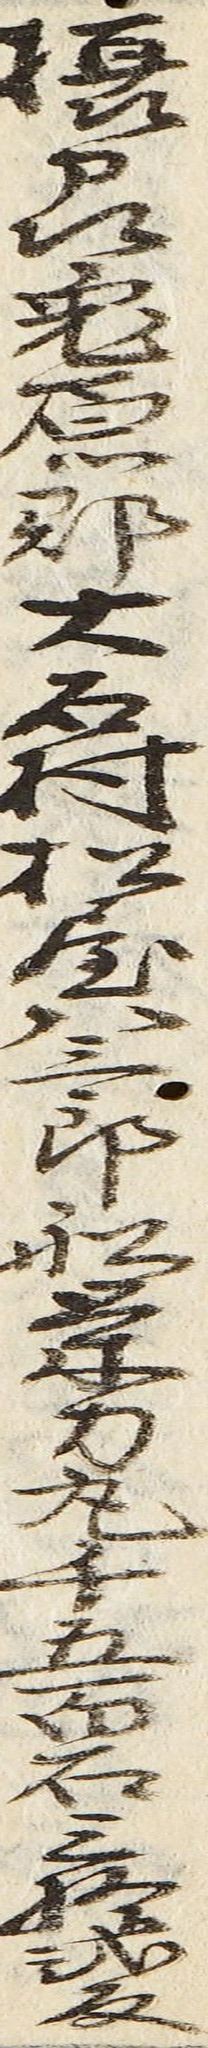摂州兎原郡大石村松屋八三郎船栄力丸千五百石三拾弐反
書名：漂流夢物語
